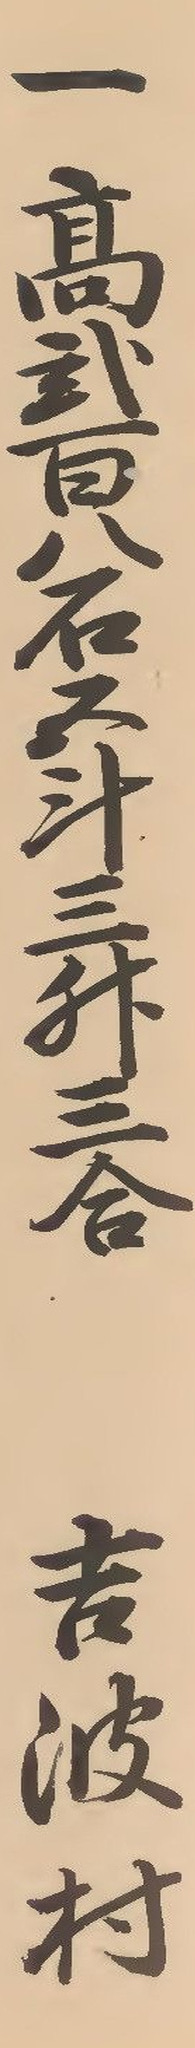一高弐百八石五斗三升三合吉波村
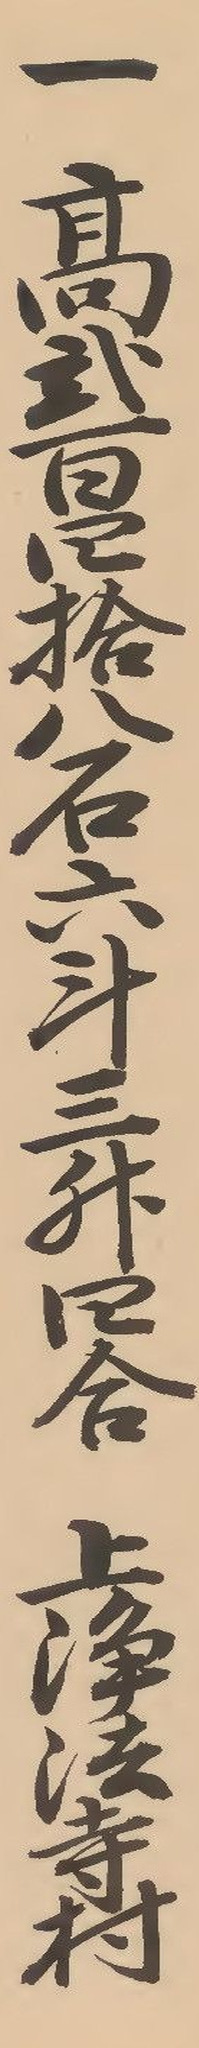一高弐百四拾八石六斗三升四合上浄法寺村
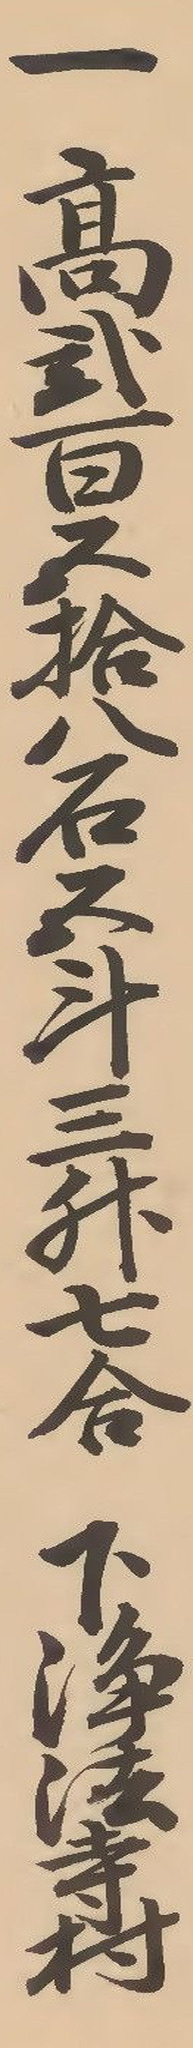一高弐百五拾八石五斗三升七合下浄法寺村
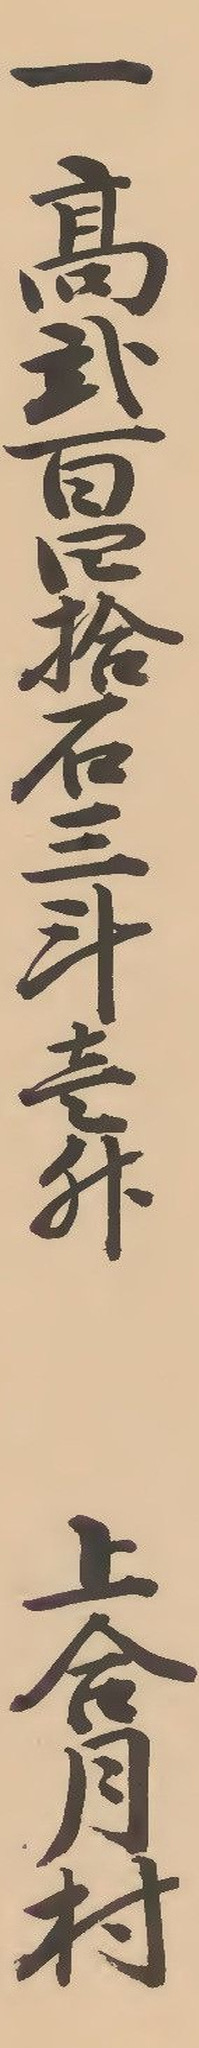一高弐百四拾石三斗壱升上合月村

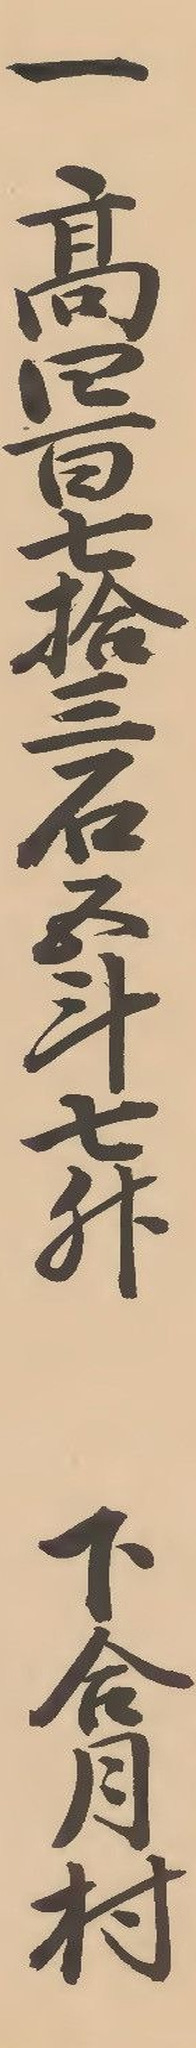一高四百七拾三石五斗七升下合月村
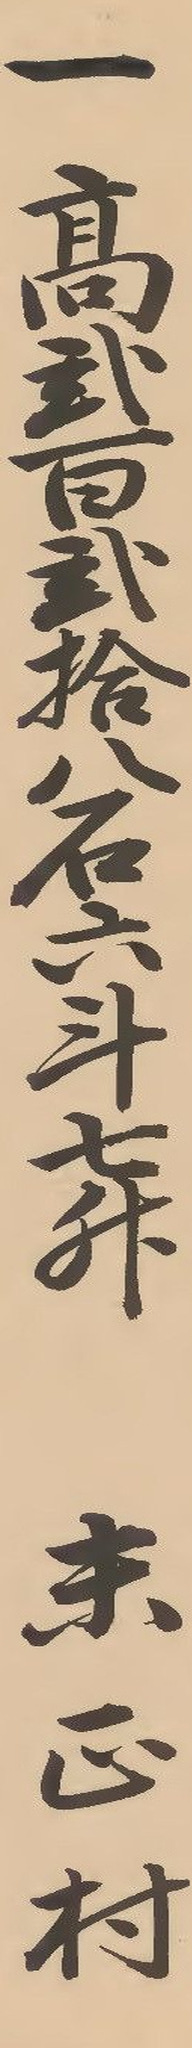一高弐百弐拾八石六斗七升末正村
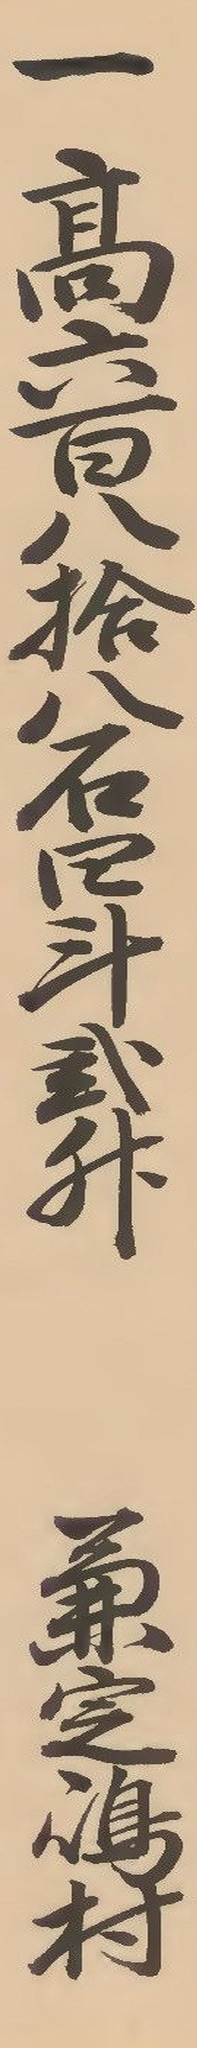一高六百八拾八石四斗弐升兼定島村
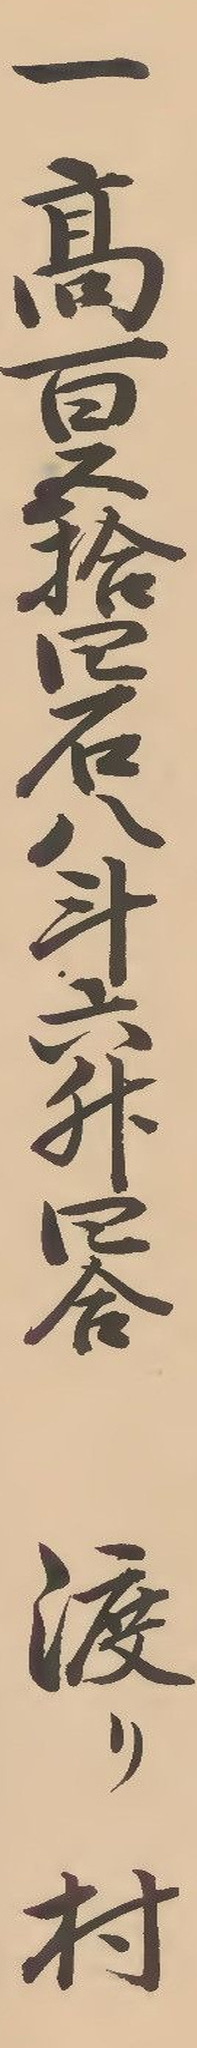一高百五拾四石八斗六升四合渡り村
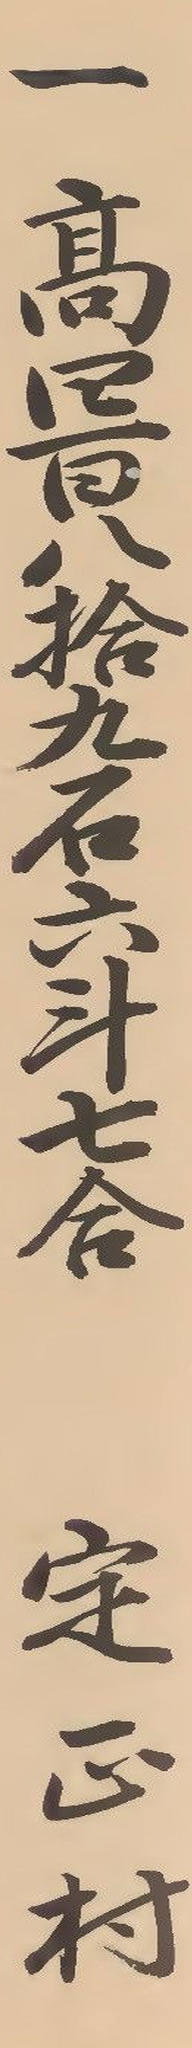一高四百八拾九石六斗七合定正村
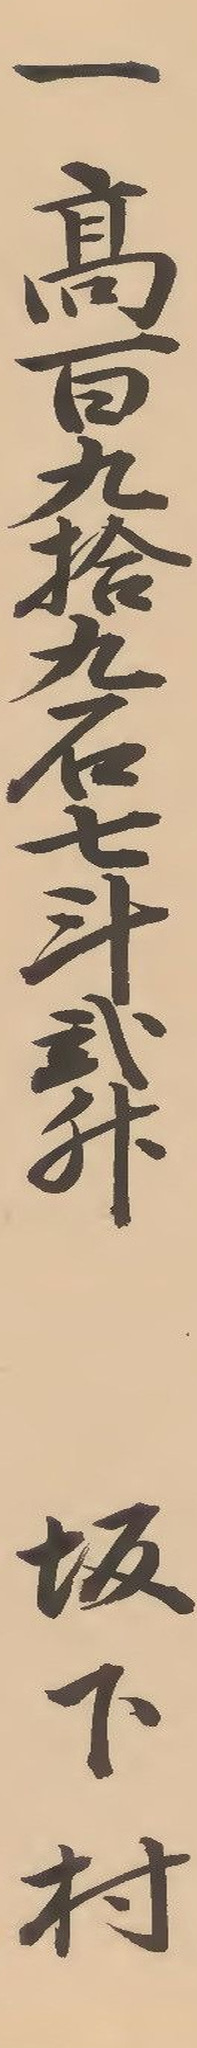一高百九拾九石七斗弐升坂下村
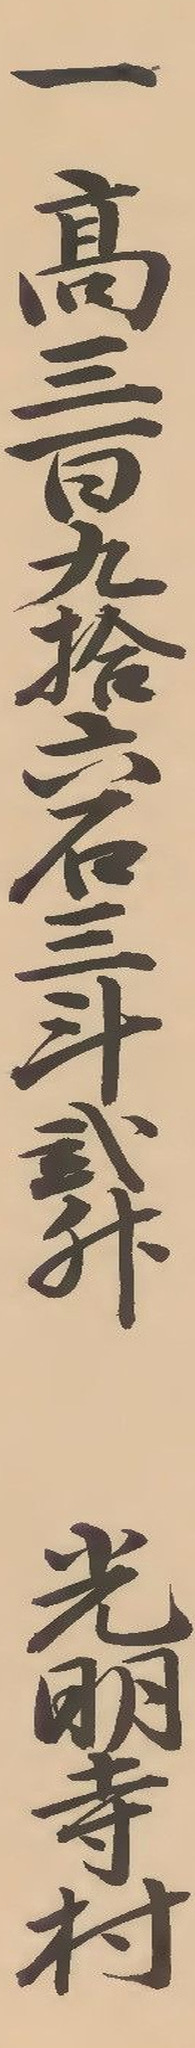一高三百九拾六石三斗弐升光明寺村
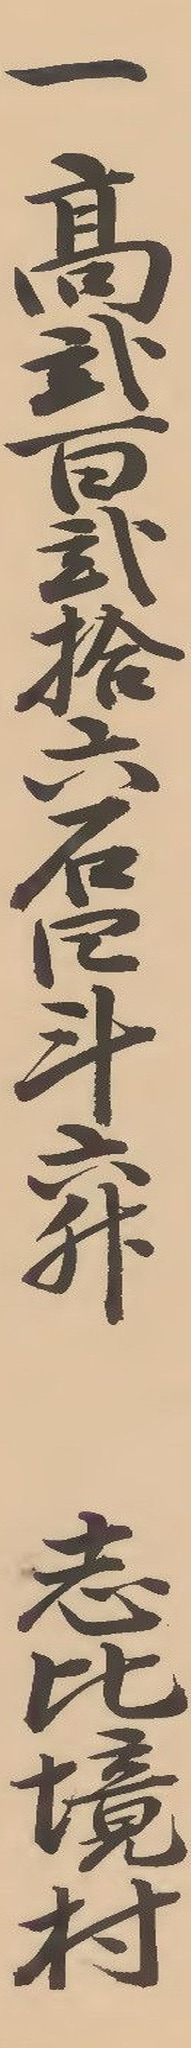一高弐百弐拾六石四斗六升志比境村

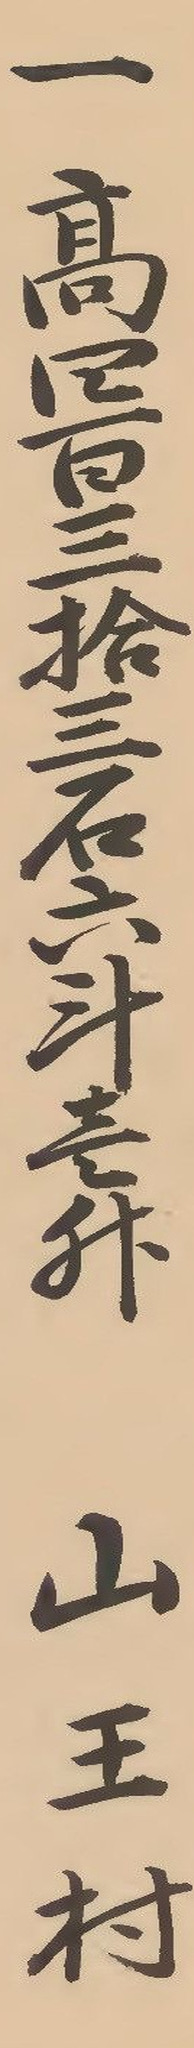一高四百三拾三石六斗壱升山王村
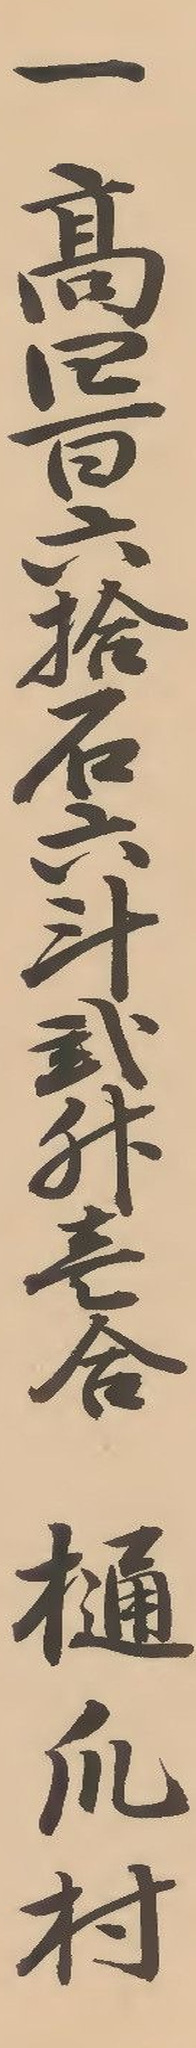一高四百六拾石六斗弐升壱合樋爪村
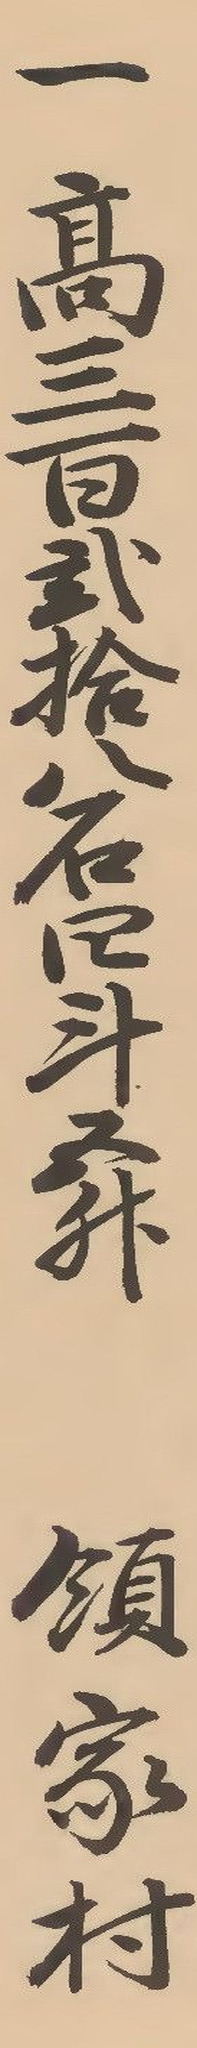一高三百弐拾八石四斗五升領家村
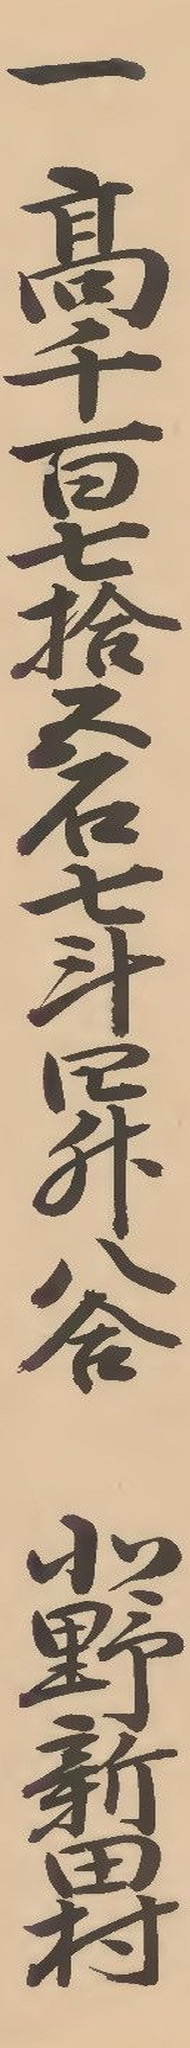一高千百七拾五石七斗四升八合北野新田村
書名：越前国郷帳
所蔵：国立公文書館 National Archives of Japan
